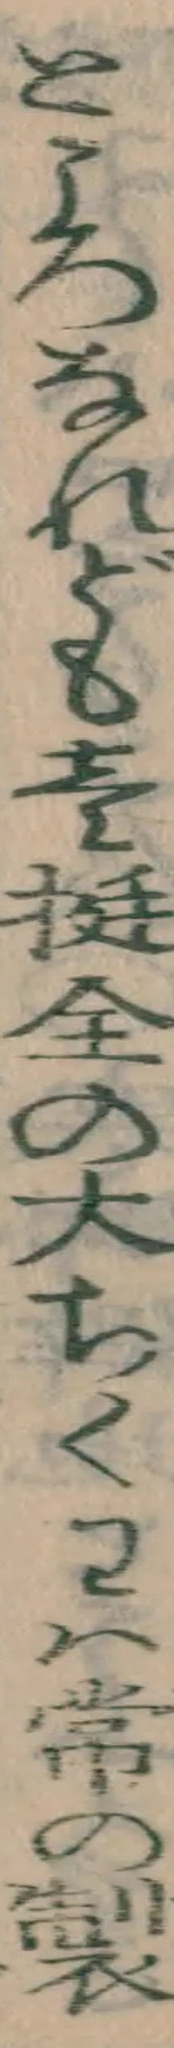ところなれども壱挺全の大ちくわは常の製
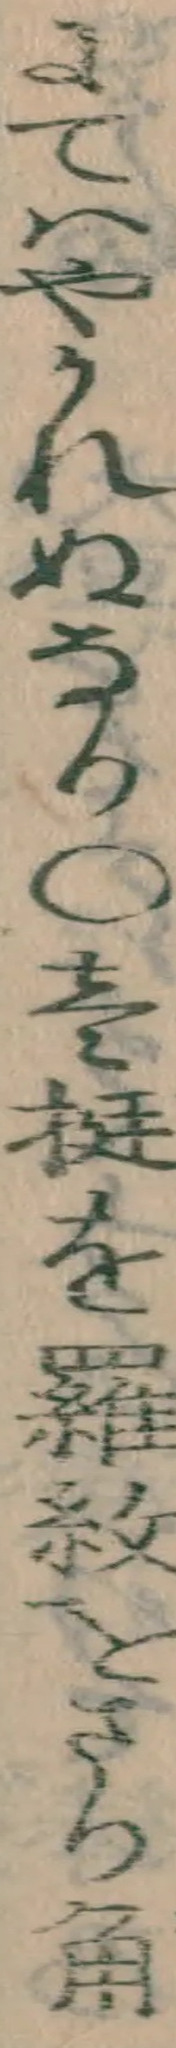にてはやかれぬなり○壱挺を羅紋をさり角
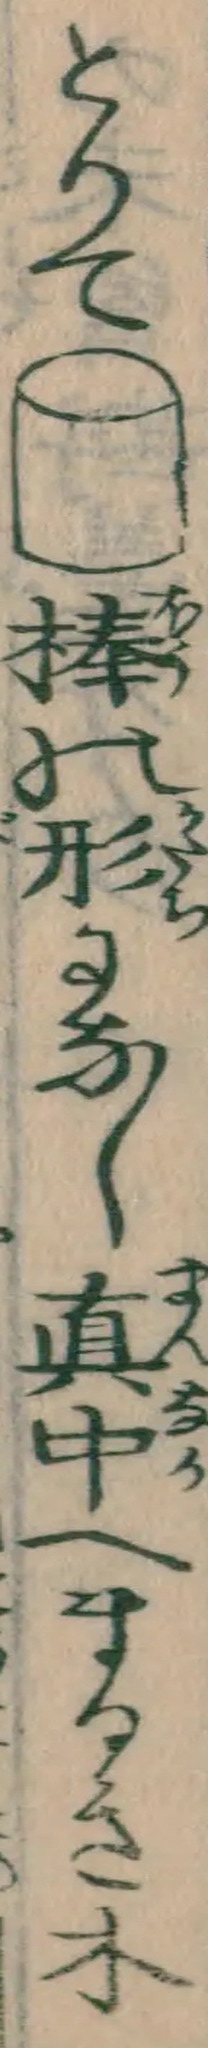とりて棒の形になし真中へまるき木
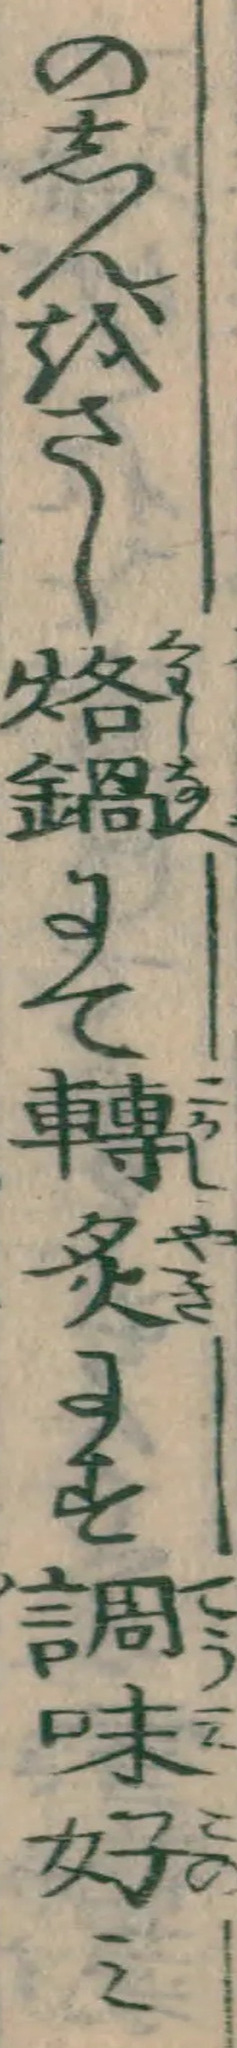のしんをさし烙鍋にて転炙にす調味好み
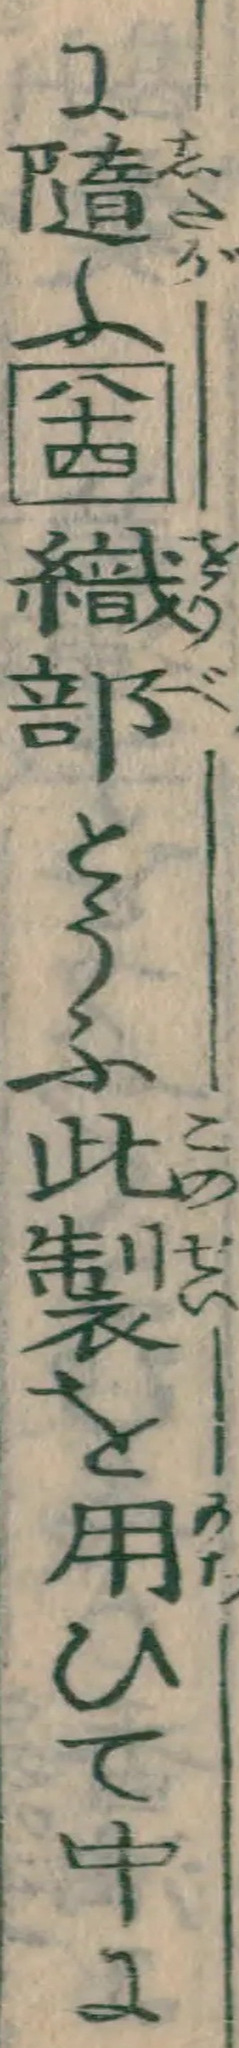に随ふ八十四織部とうふ此製を用ひて中に
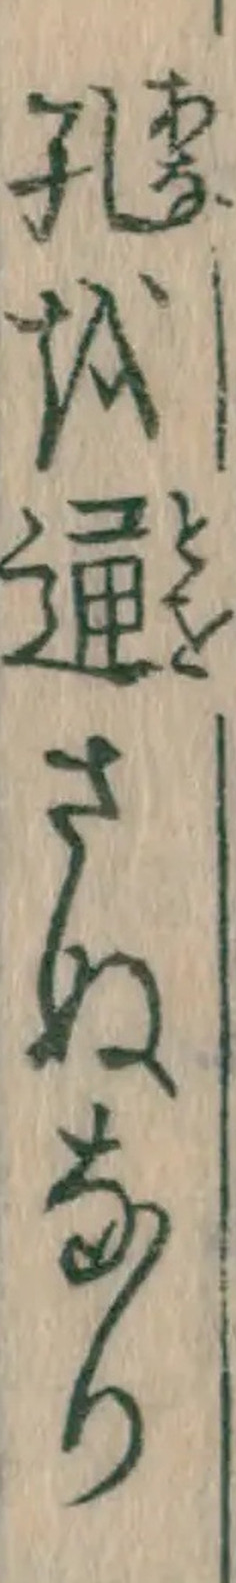孔を通さぬなり
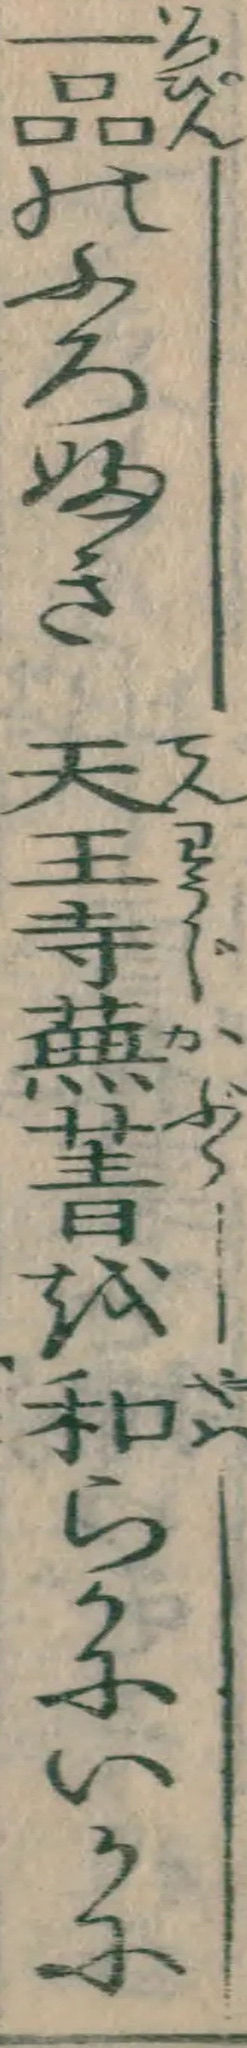卅一一品のふろふき天王寺蕪菁を和らかにいかに
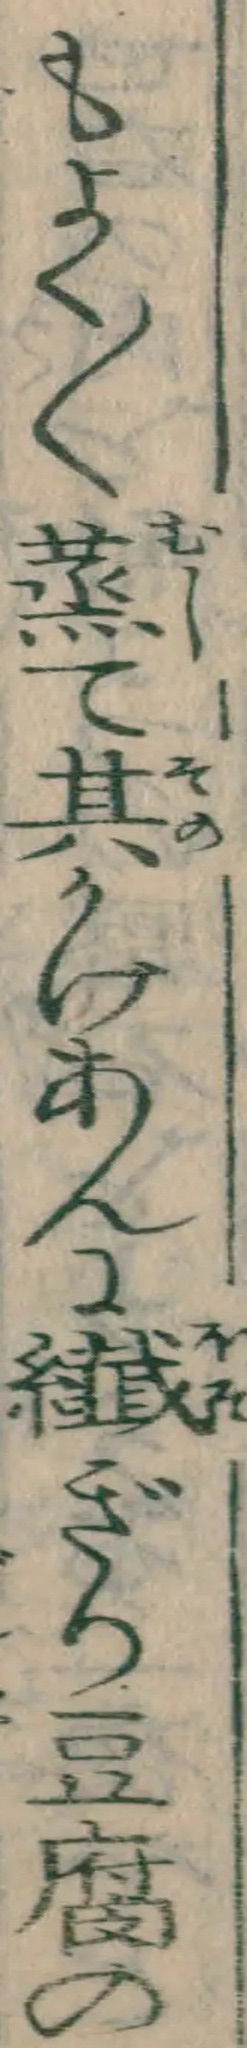もよく〳〵蒸て其かけあんに繊ぎり豆腐の
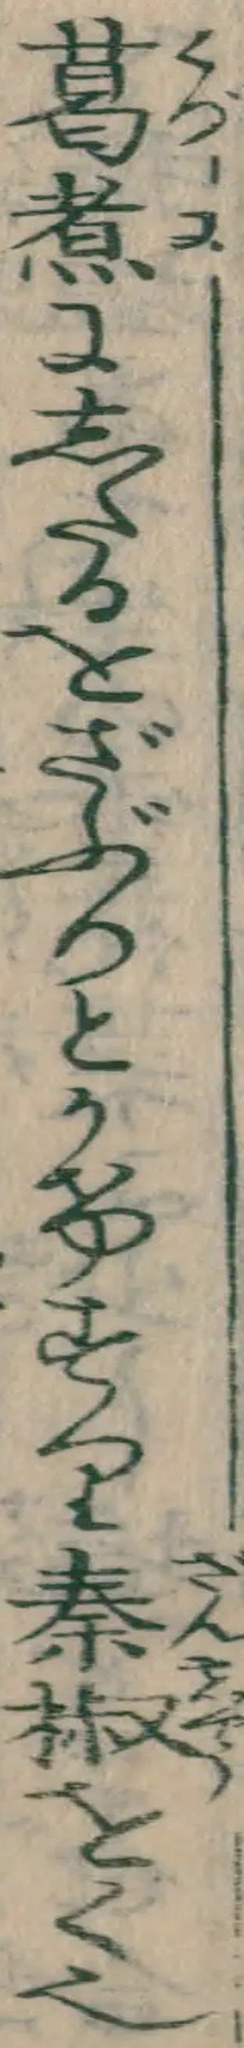葛煮にしたるをざぶりとかけすり秦椒をく也
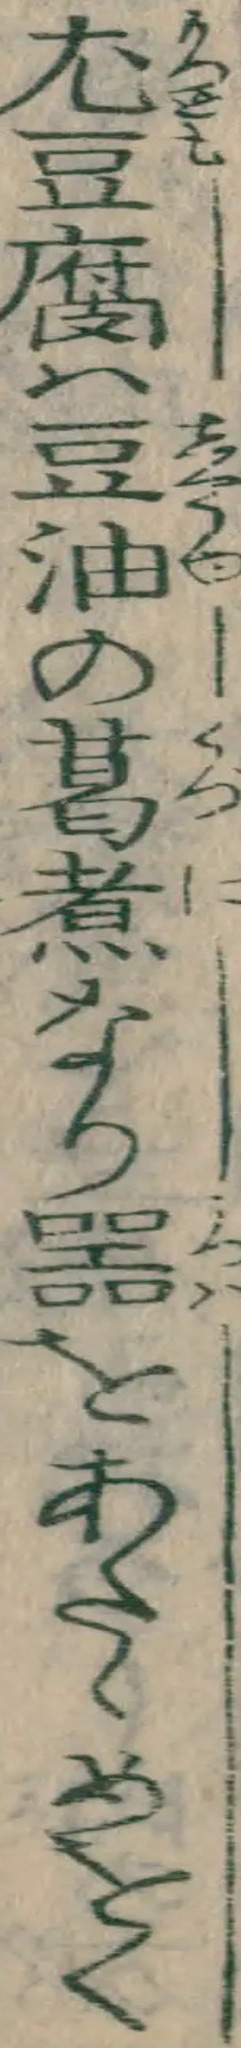尤豆腐は豆油の葛煮なり器をあたゝめをく
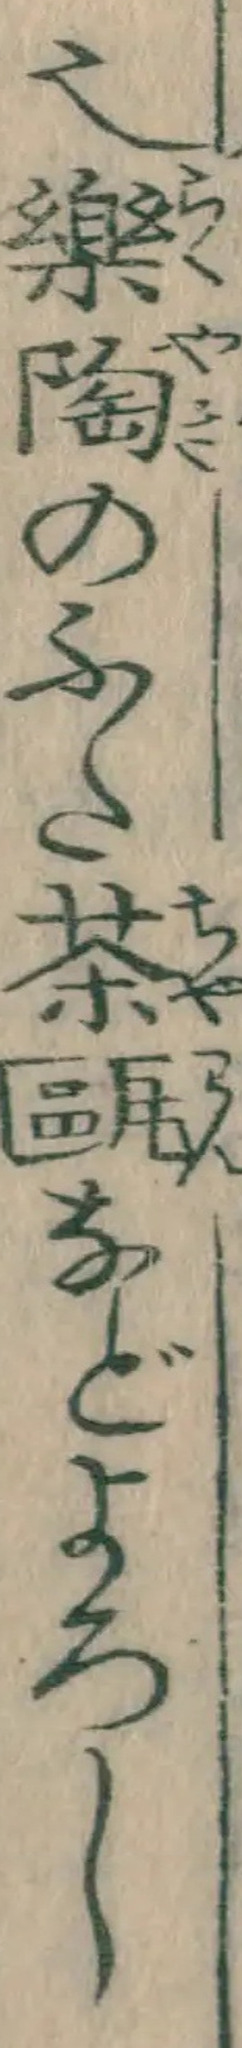也楽陶のふた茶甌などよろし

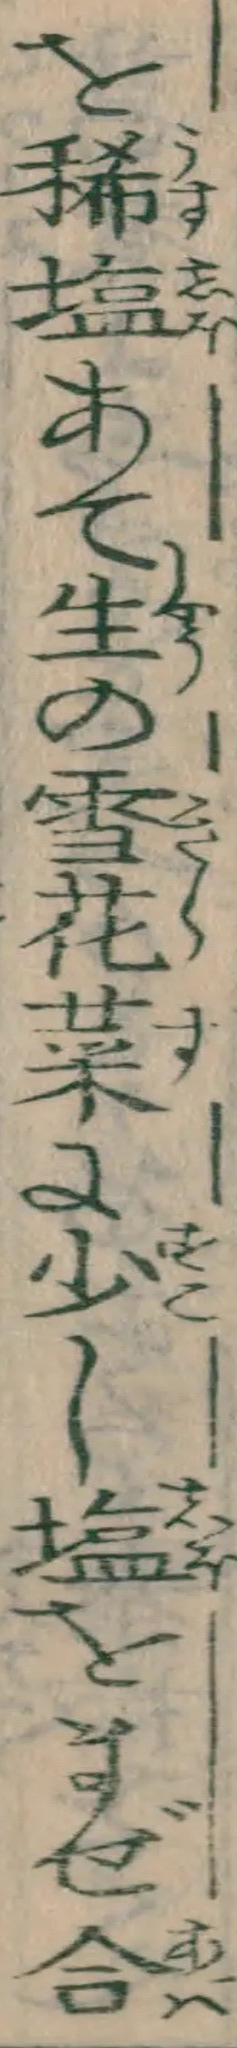を稀塩あて生の雪花菜に少し塩をまぜ合
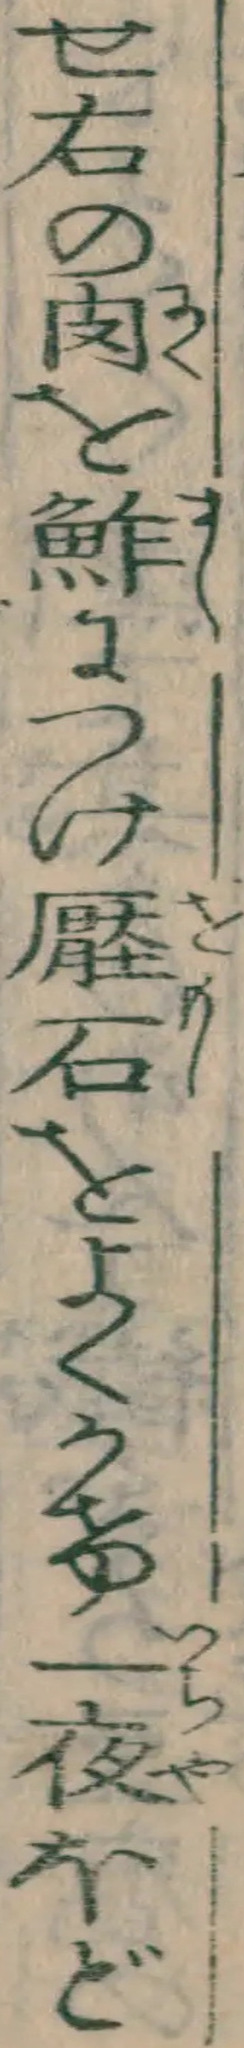せ右の肉を鮓につけ圧石をよくかけ一夜ほど
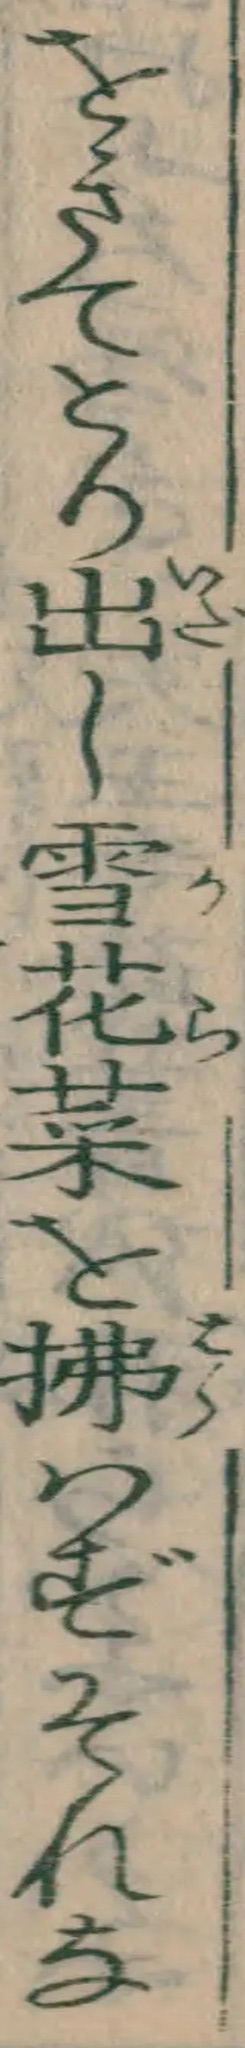をきてとり出し雪花菜を払はずそれな
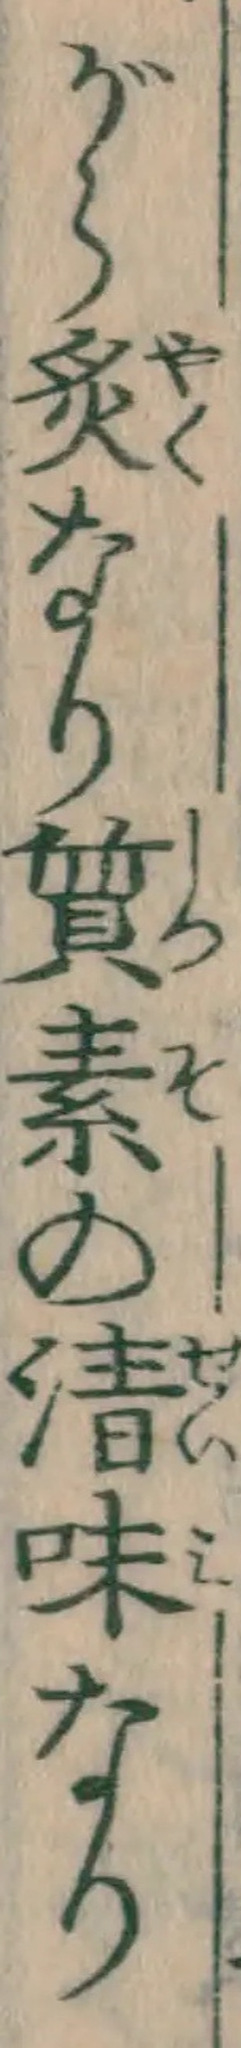がら炙なり質素の清味なり
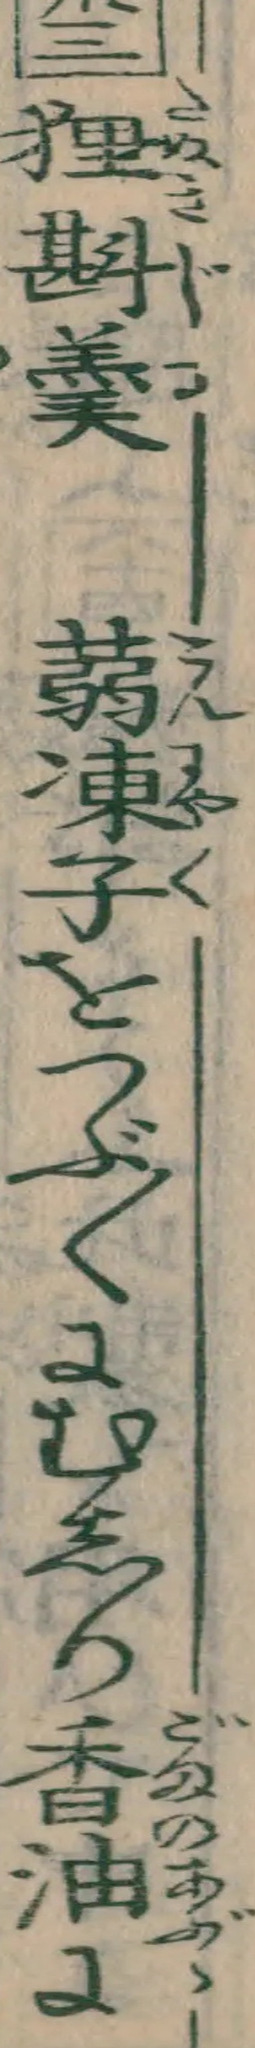卅三狸斟羹蒻凍子をつぶ〳〵にむしり香油に
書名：豆腐百珍. 続編
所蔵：国立国会図書館 National Diet Library, JAPAN
